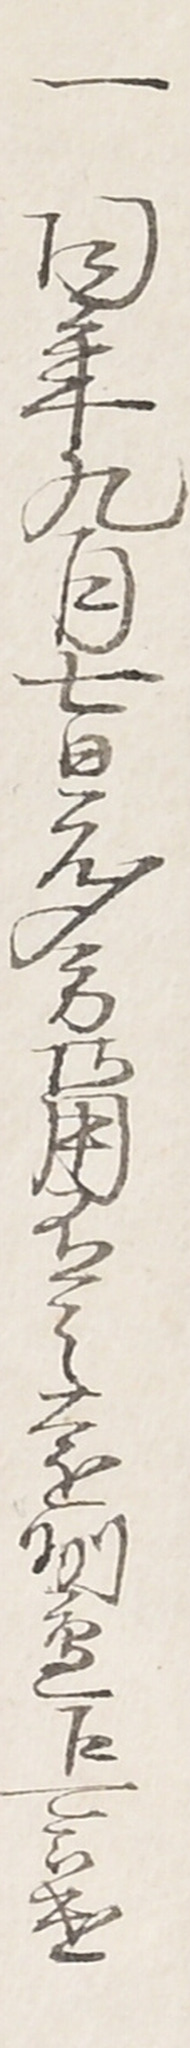一同年九月七日元〆方御用有之遠州邊江可被遣
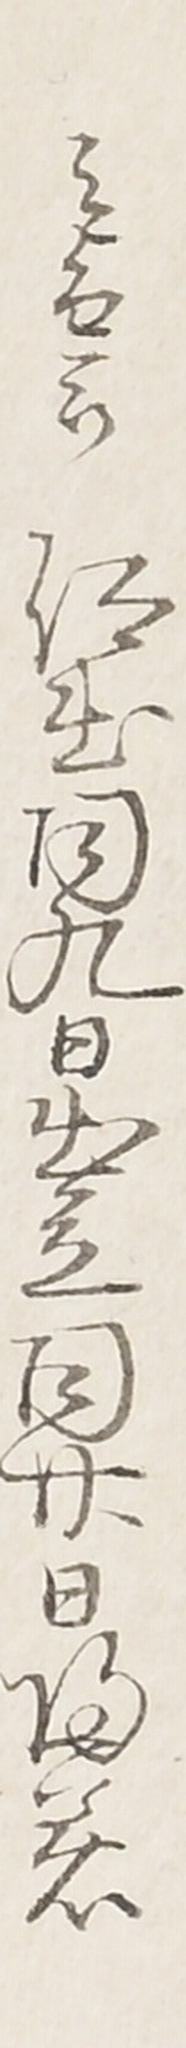之旨被仰出同九月出立同廿日帰着
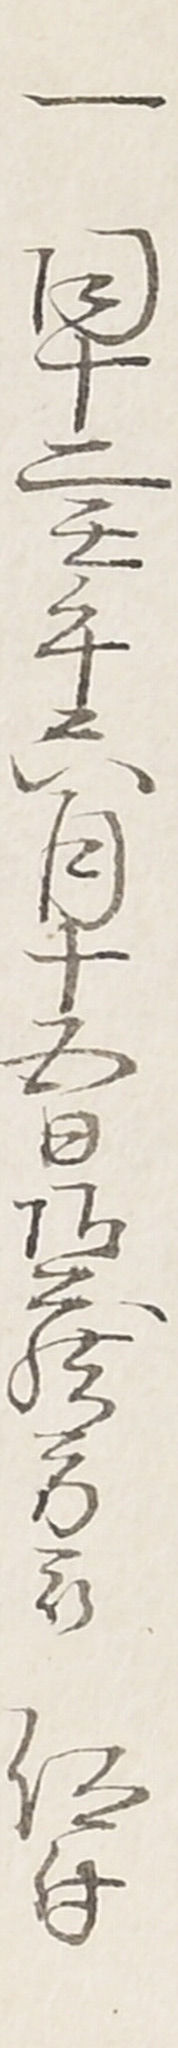一同十二壬午六月十五日御蔵方被仰付
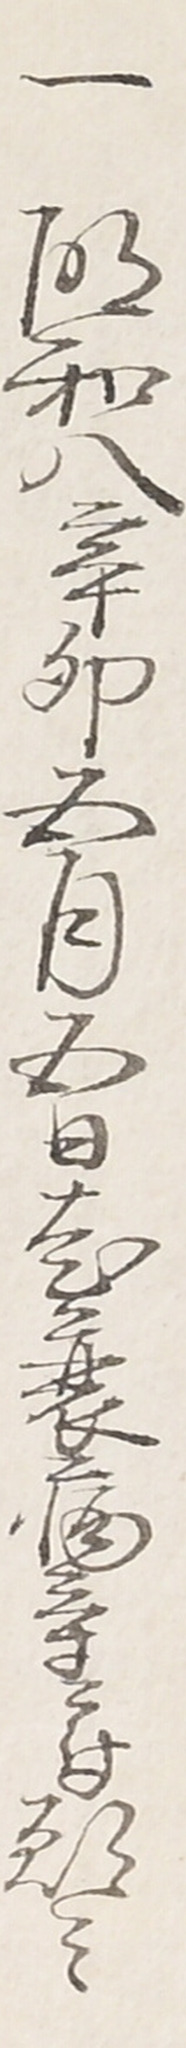一明和八辛卯五月五日老衰病気ニ付願之
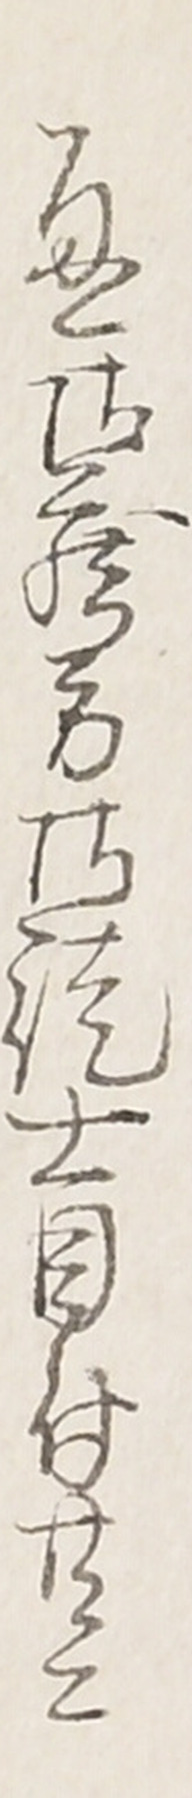通御蔵方御徒士目付共ニ
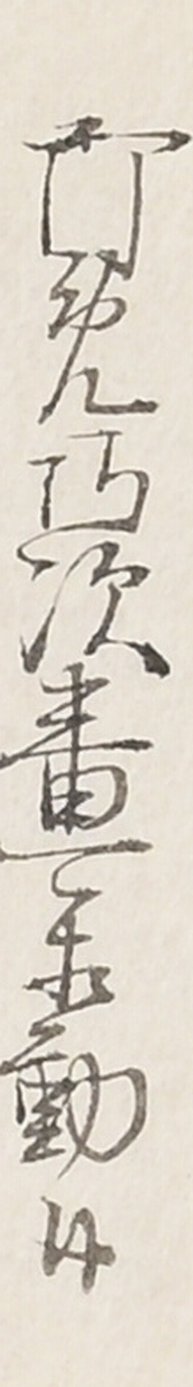御免御次番可相勤候
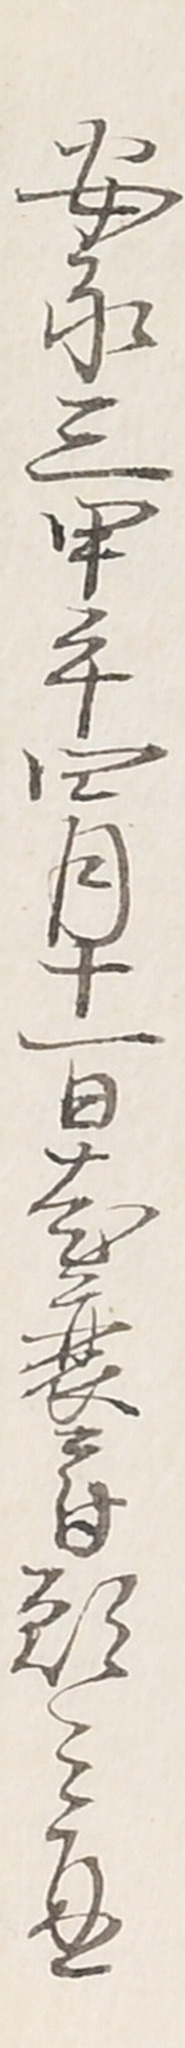一安永三甲午四月十一日老衰ニ付願之通
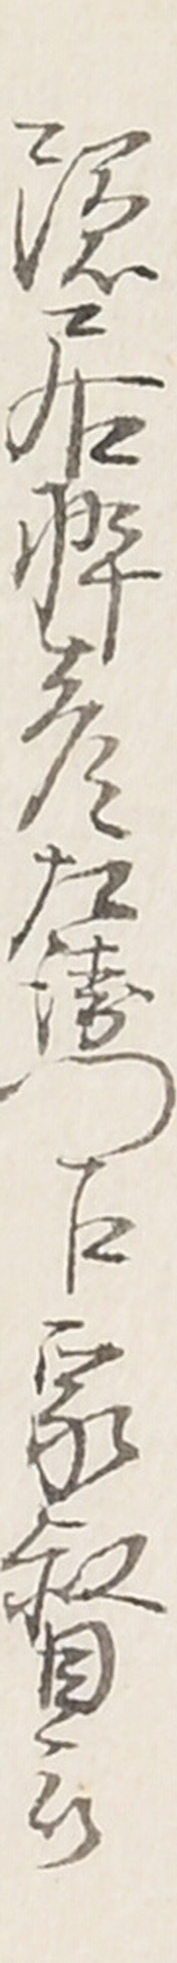隠居忰彦左衛門江家督被
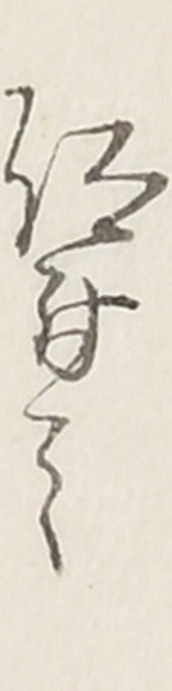仰付之
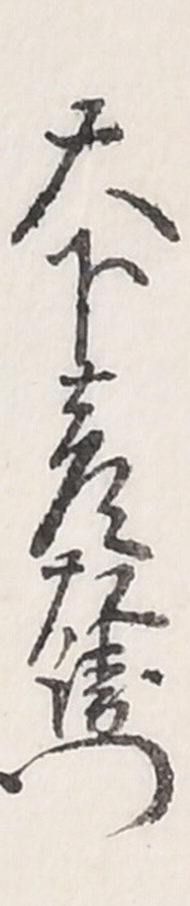大下彦左衛門
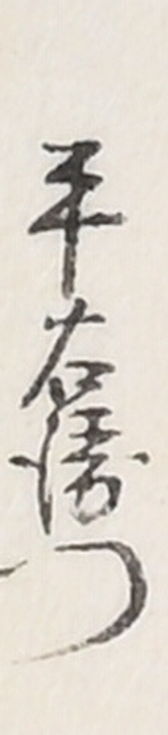平右衛門
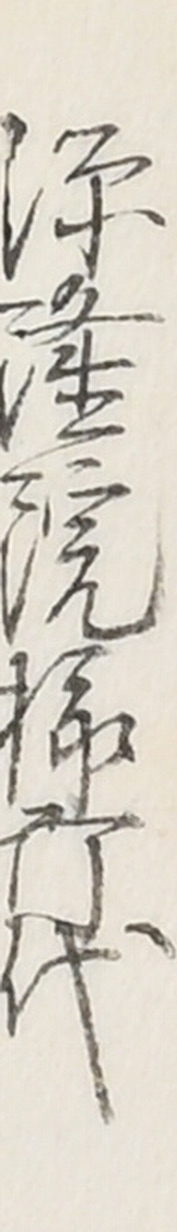源隆院様御代
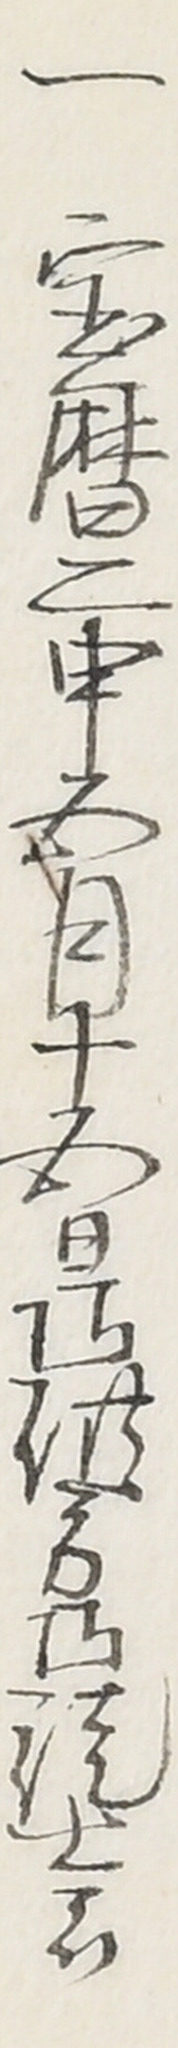一宝暦ニ申五月十五日御供方御徒士被
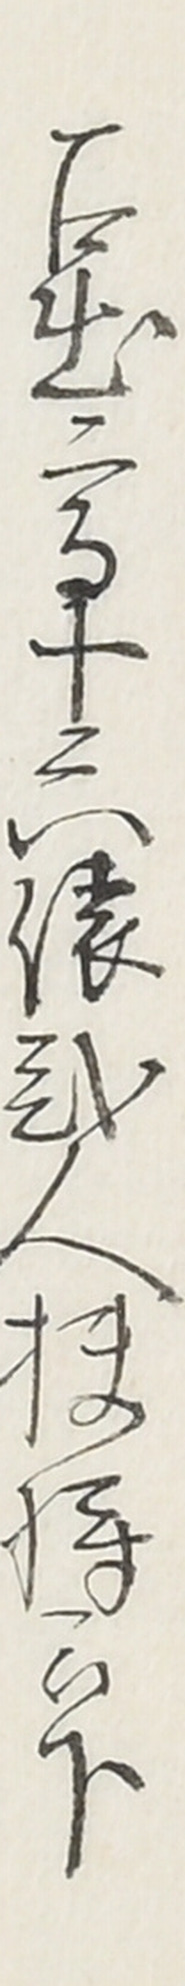召出高十六俵弐人扶持被下
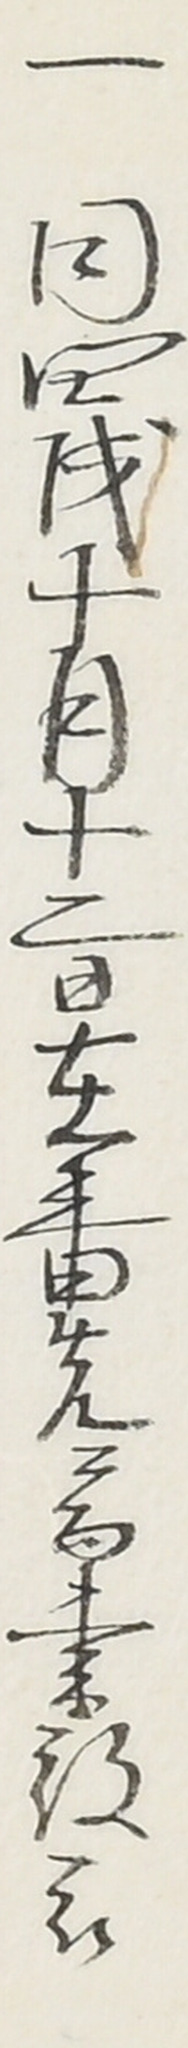一同四戌十月十二日在番先ニ而書役被
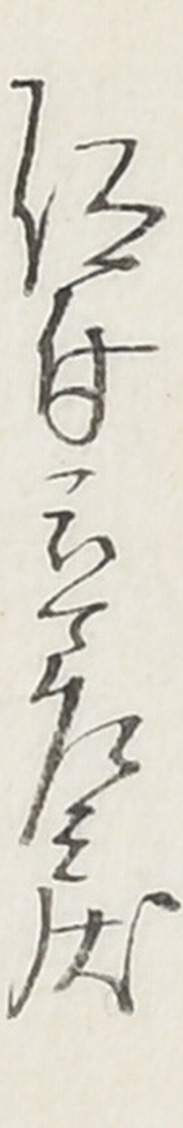仰付被差戻
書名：無足諸士勤仕録（四）
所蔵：伊那市立高遠町図書館・合同会社AMANE
